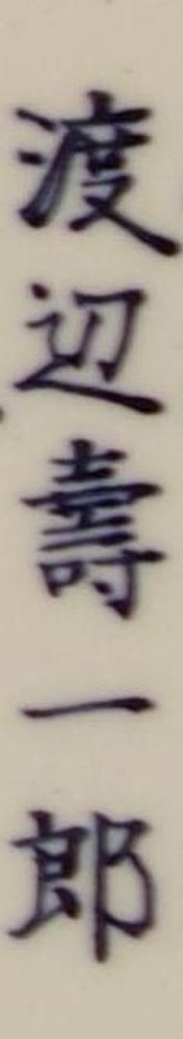渡辺壽一郎
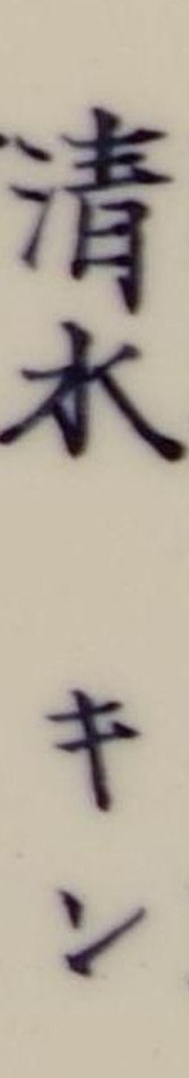清水キン
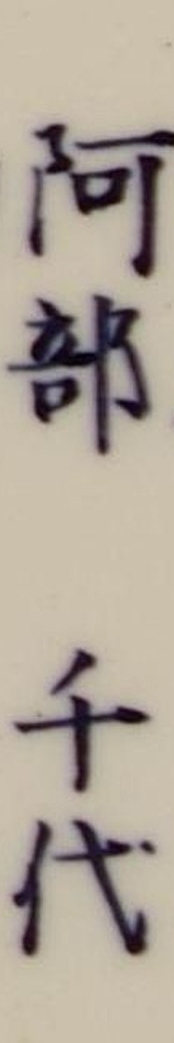阿部千代
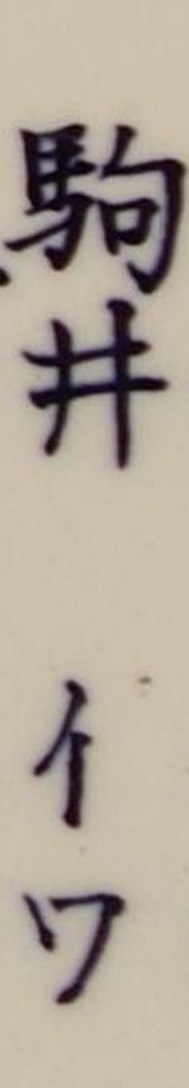駒井イワ
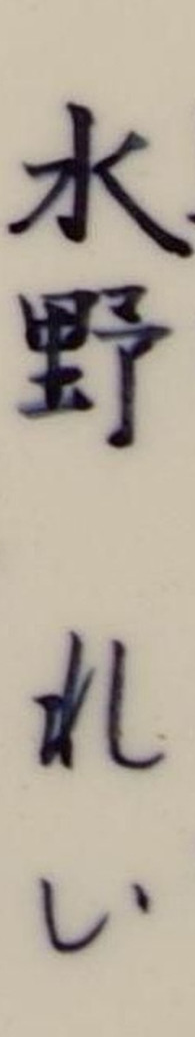水野れい
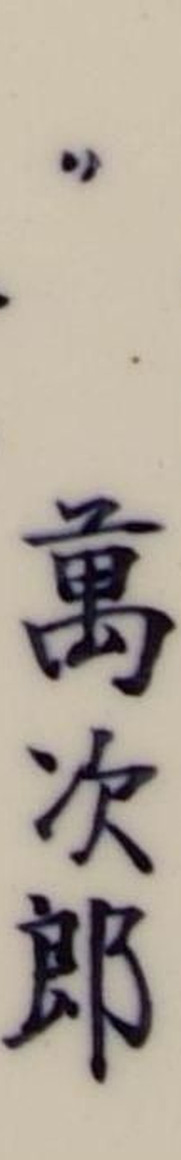萬次郎
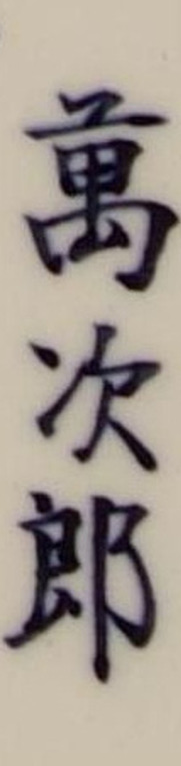萬次郎
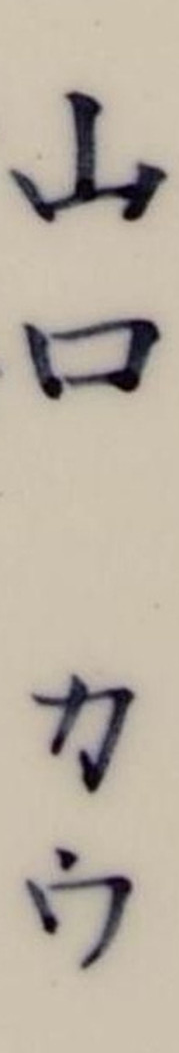山口カウ
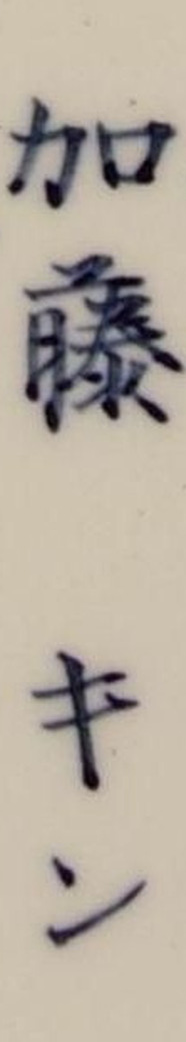加藤キン
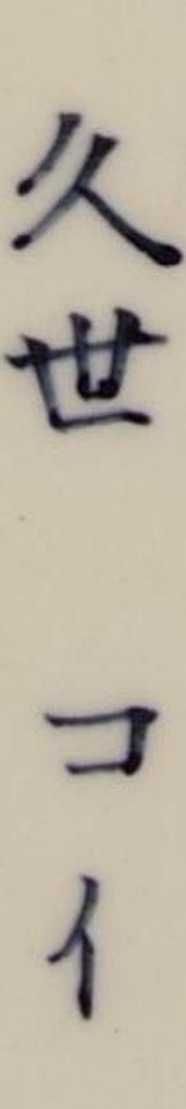久世コイ
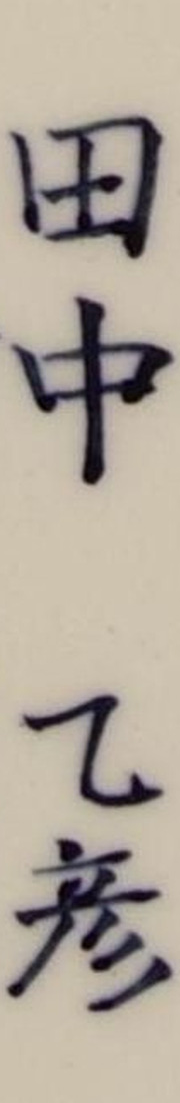田中乙彦
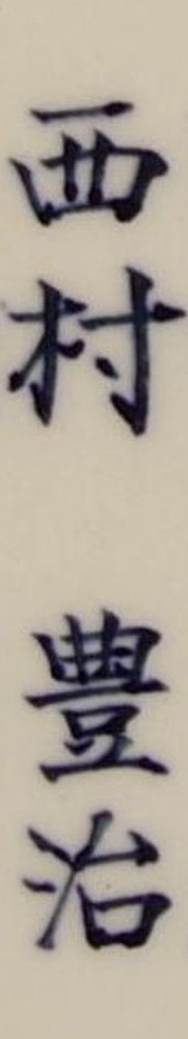西村豊治
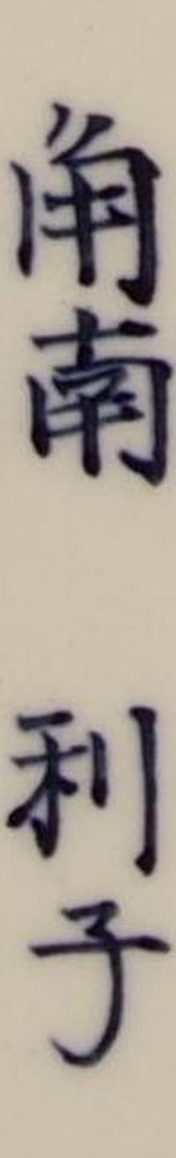角南利子
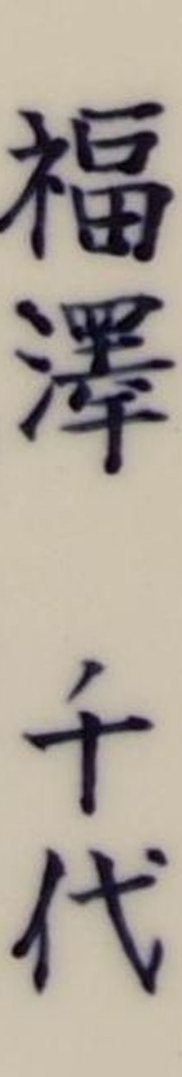福澤千代
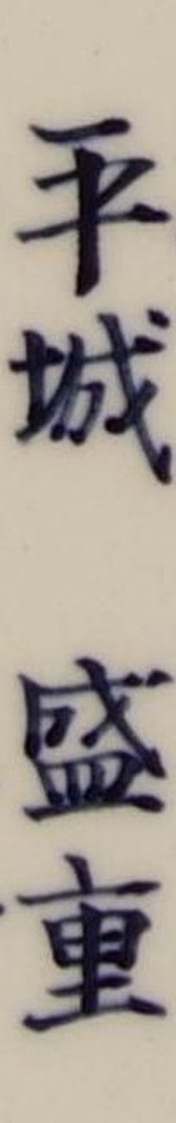平城盛重
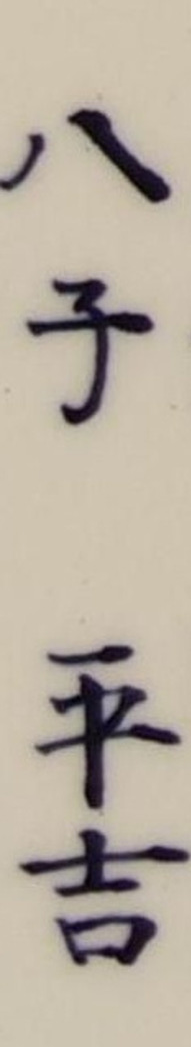八子平吉
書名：M~S
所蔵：高野山金剛峯寺
